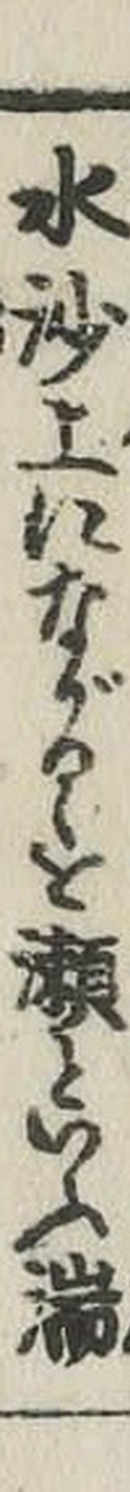水沙上にながるゝを瀬といふ湍
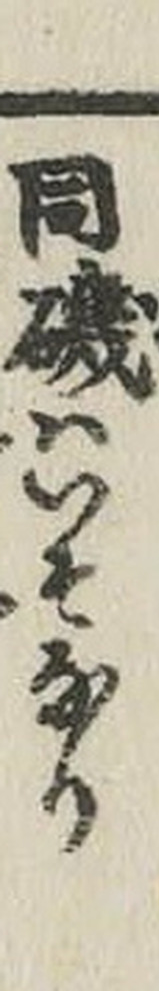同磯はいそなり
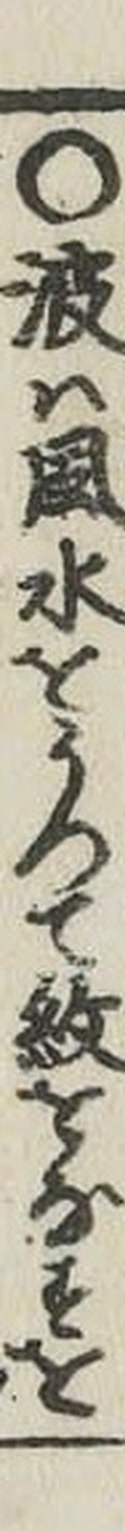○波は風水をうつて紋をなすを
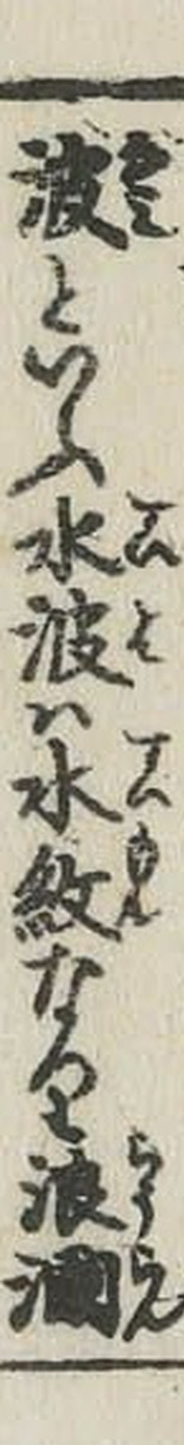波といふ水波は水紋なり浪瀾
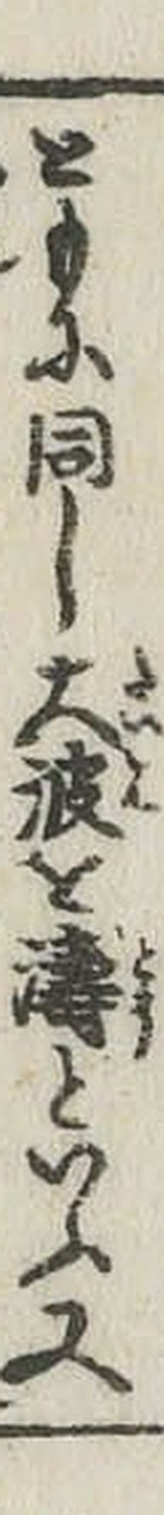ともに同し大波を濤といふ又
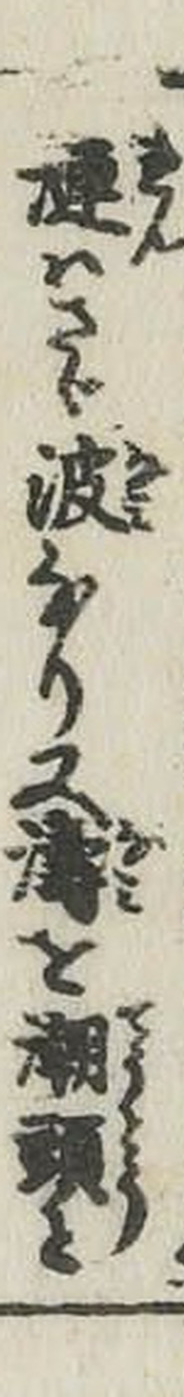漣はさゞ波なり又濤を潮頭と
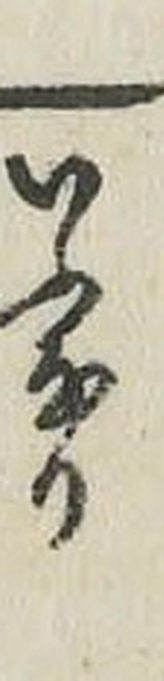いふなり
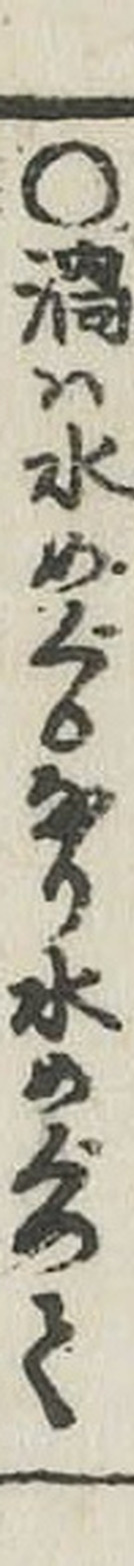○渦は水めぐるなり水めぐつて
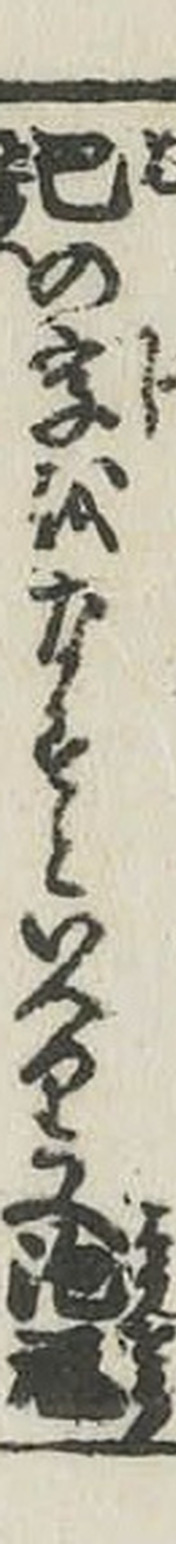巴の字をなすといへり又泡漚
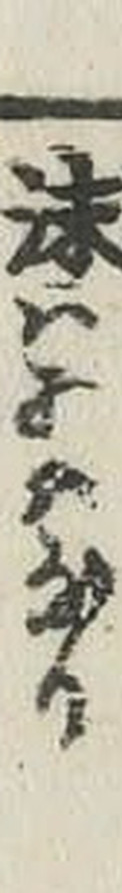沫はあはなり
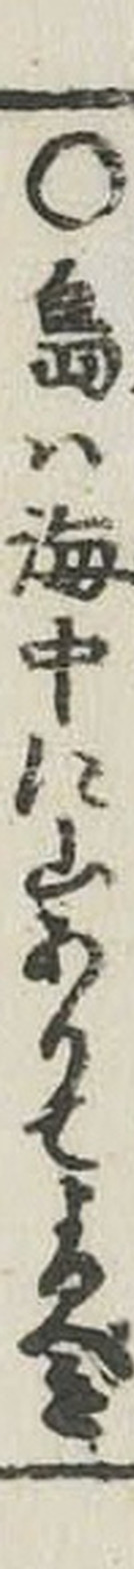○島は海中に山ありてよるべき
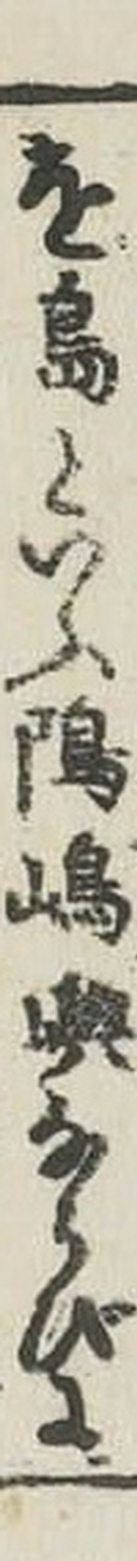を島といふ隝嶋嶼ならびに
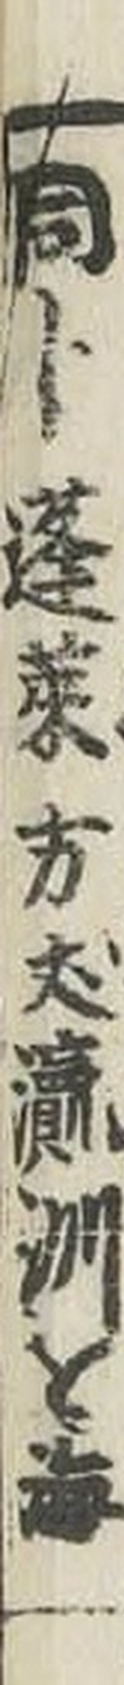同し蓬莱方丈瀛洲を海
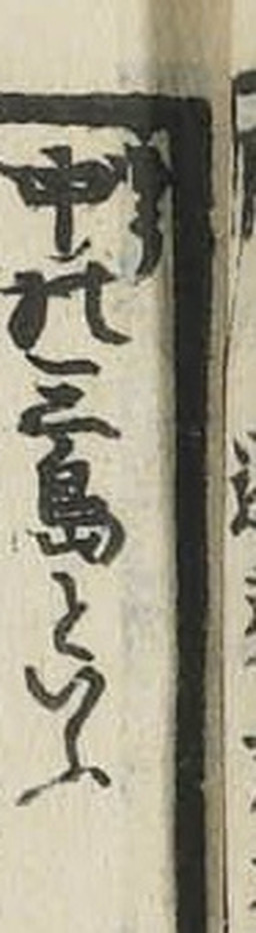中の三島といふ
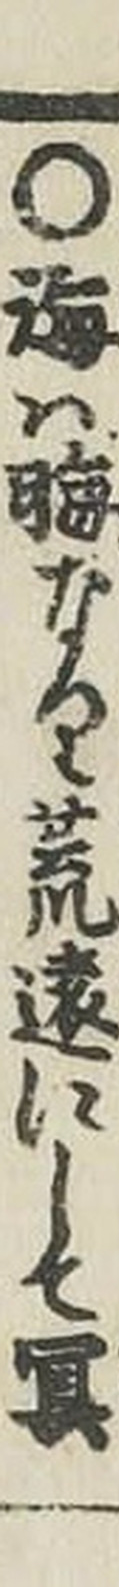○海は晦なり荒遠にして冥
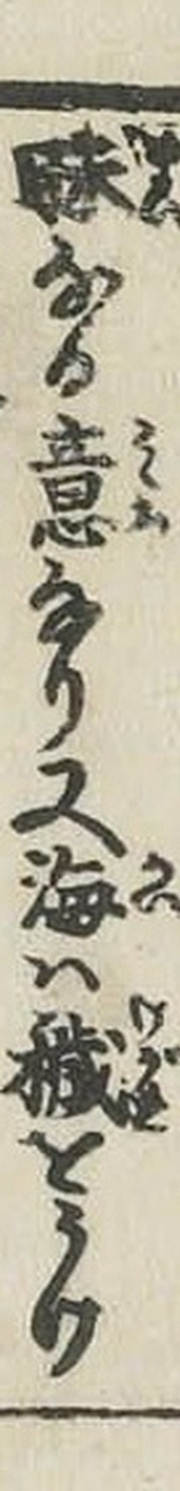昧なる意なり又海は穢をうけ
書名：増補頭書訓蒙図彙大成 10巻 2:巻之1-3
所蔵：東京学芸大学教育コンテンツアーカイブ
